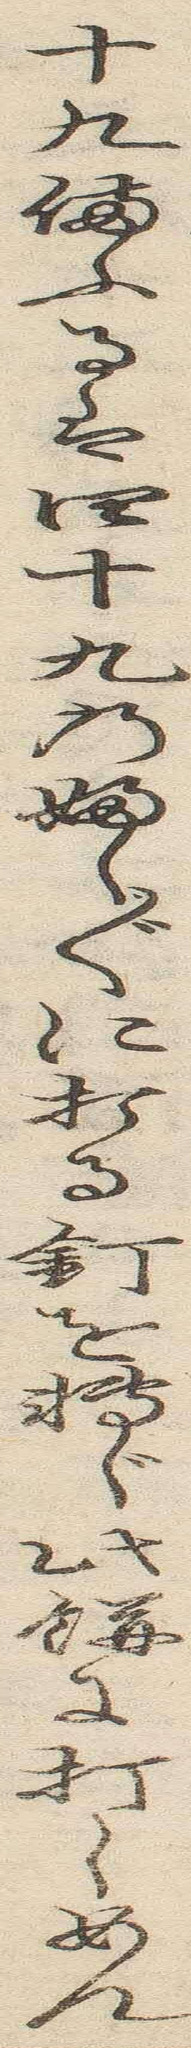十九備ふるは四十九のふし〴〵に打る釘を轉じ此餅に打しめん
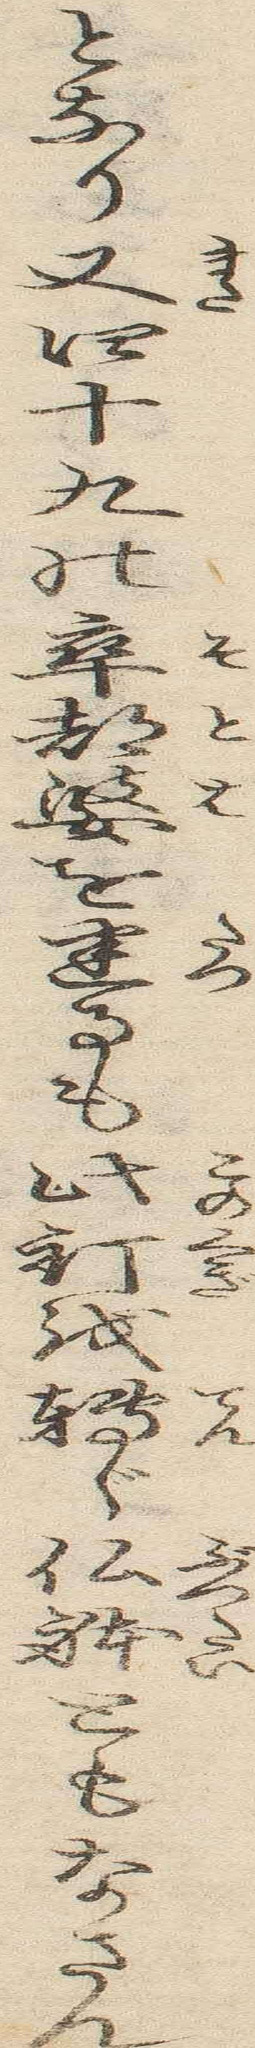となり又四十九の卒都婆を建るも此釘を轉じ仏躰ともなさん
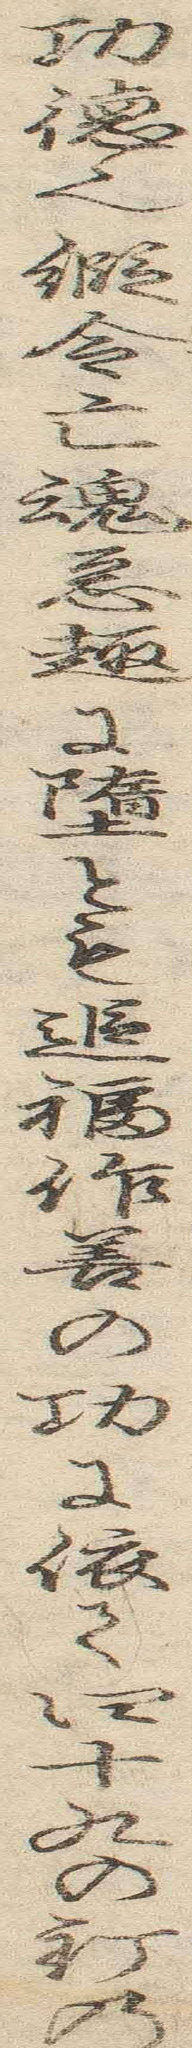功徳也假令亡魂悪趣に墮とも追福作善の功に依て四十九の釘の
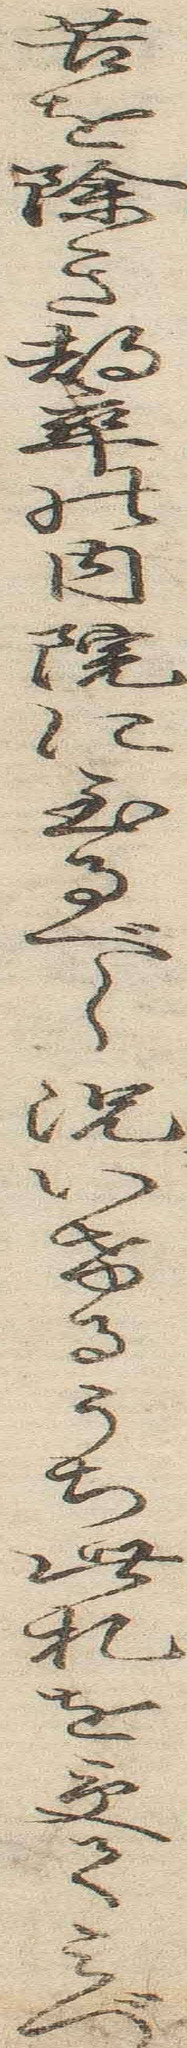苦を除き都卒の内院に至るべし況いけるうち此札を受てみづ
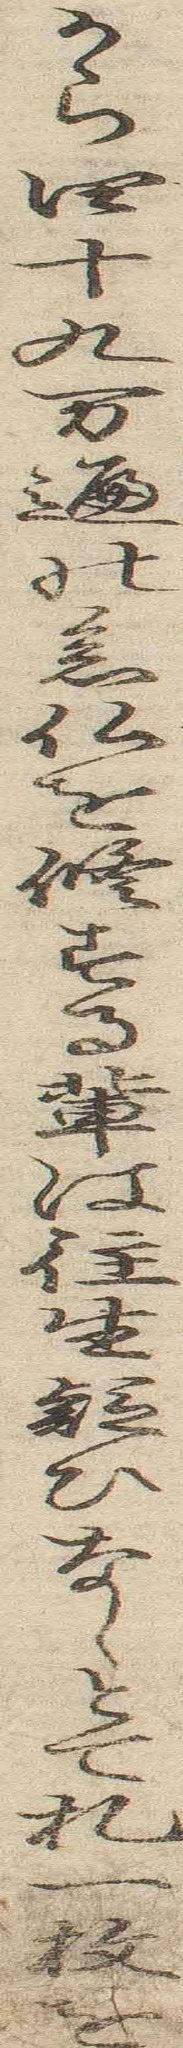から四十九万遍の念仏を修する輩は往生疑ひなしとて札一枚を
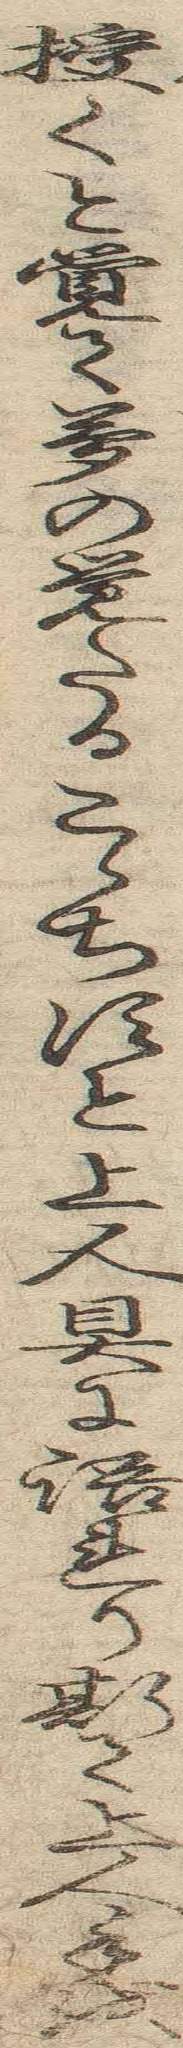授くと覚て夢の覚たるこゝちすと上人具に語れり斯て上人手を

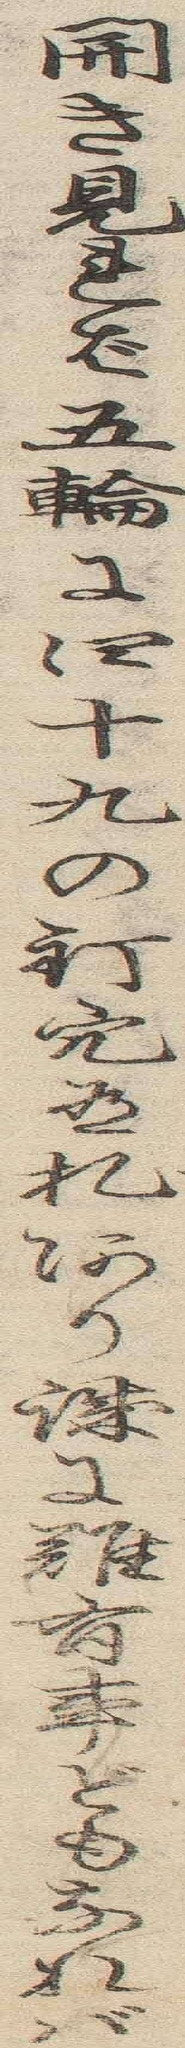開き見れば五輪に四十九の釘穴有札あり誠に難有事どもなれば
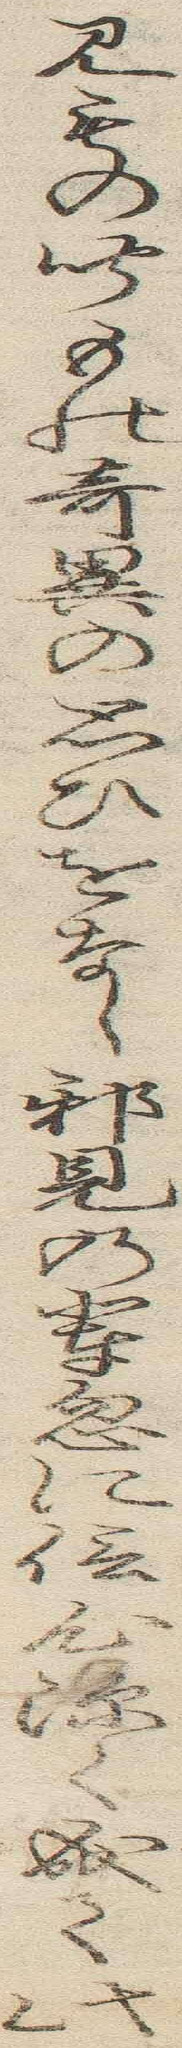見もの聞もの奇異の思ひをなし邪見の輩忽に信心深く成て此
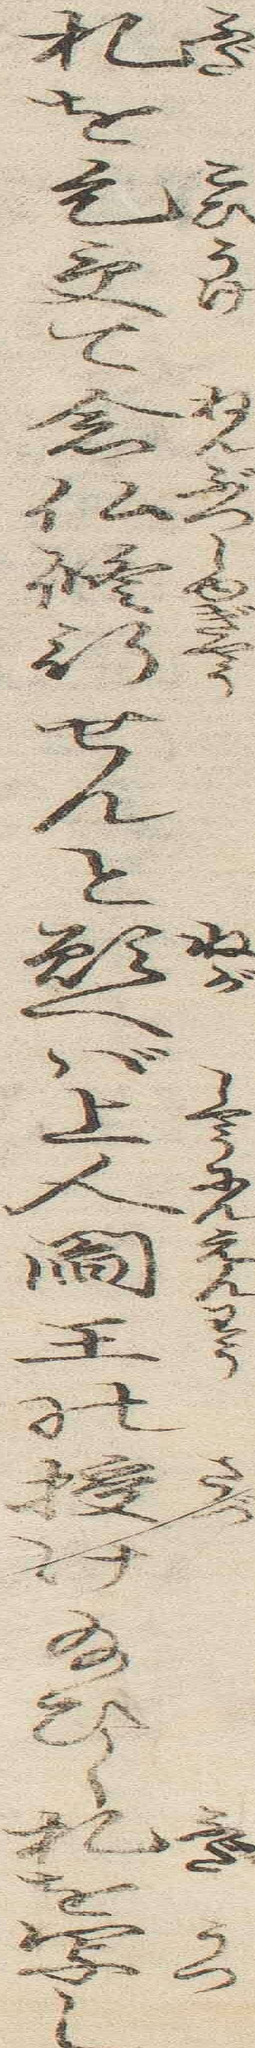札を乞受て念仏修行せんと願へば上人閻王の授け給ひし札を写し
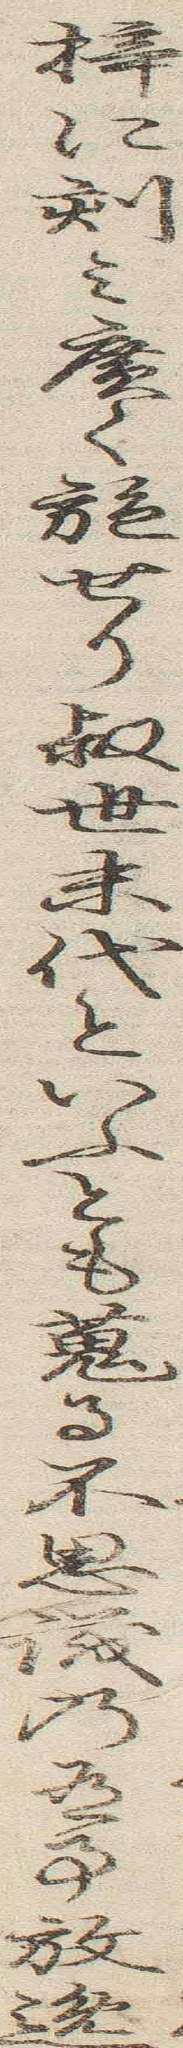梓に𠜇み廣く施せり叔世末代といふとも蒐る不思議の有事放逸
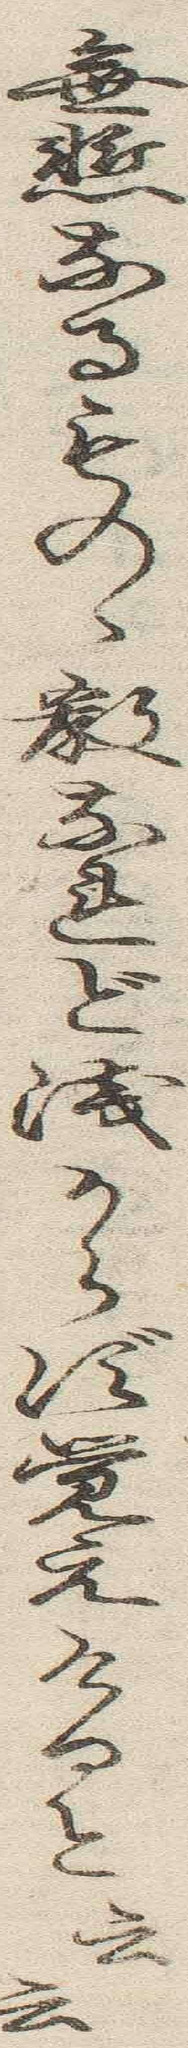無慙なるものゝ敎なれど浅からず覚えけると云云
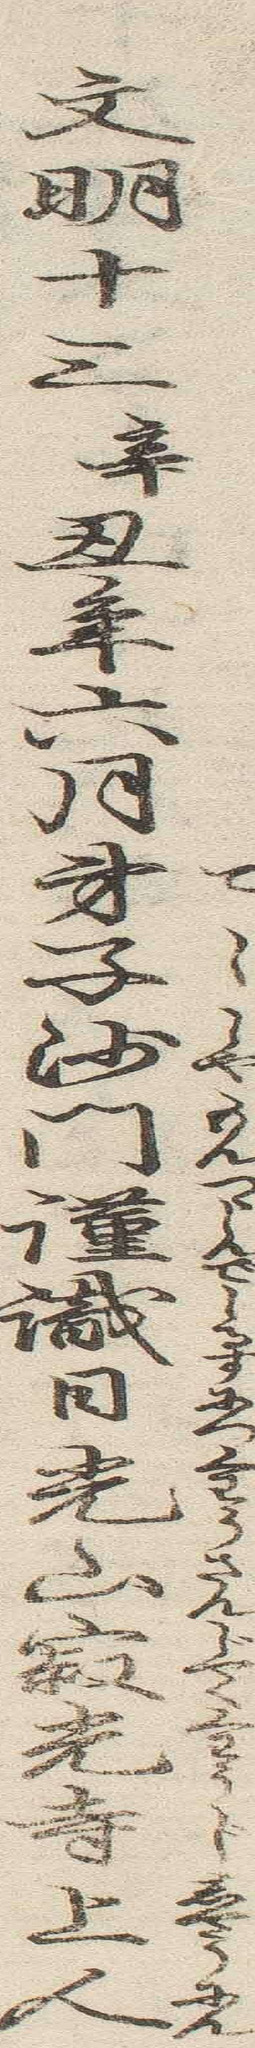文明十三辛丑年六月㐧子沙門謹識日光山寂光寺上人
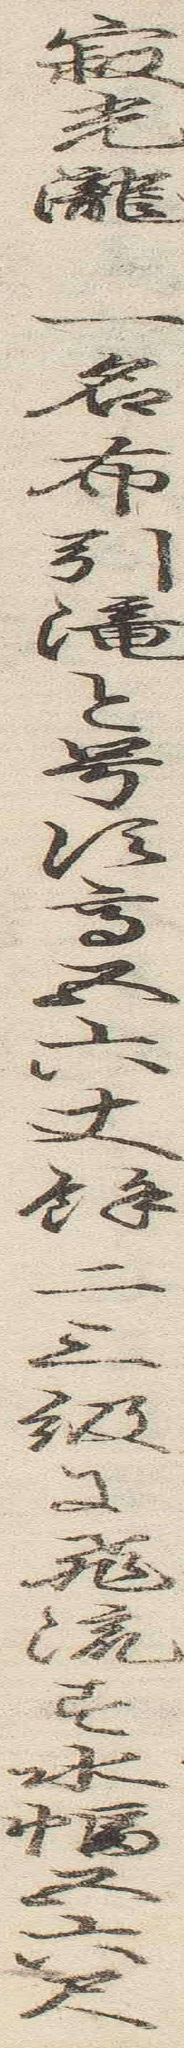寂光瀧一名布引滝と号す高五六丈餘二三級に飛流す水幅五六尺
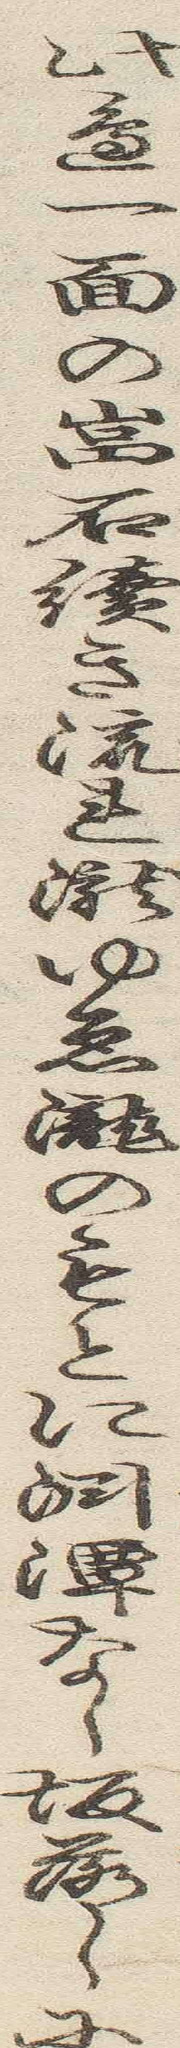此邊一面の嵓石續き流れ瀧ゆゑ瀧のもとに渕潭なし坂落しに
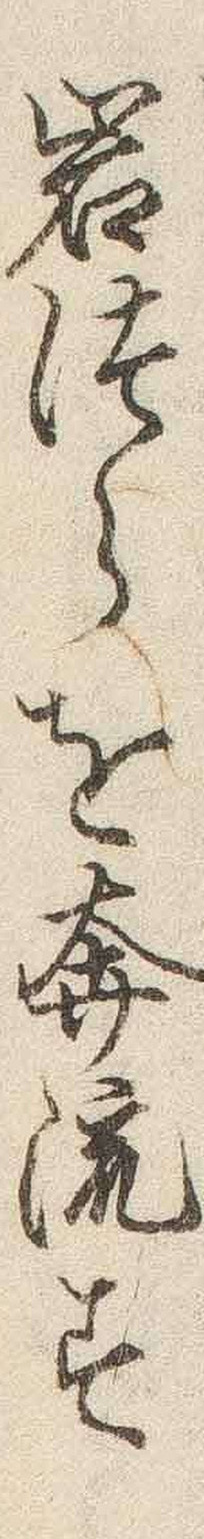岩つらを奔流す
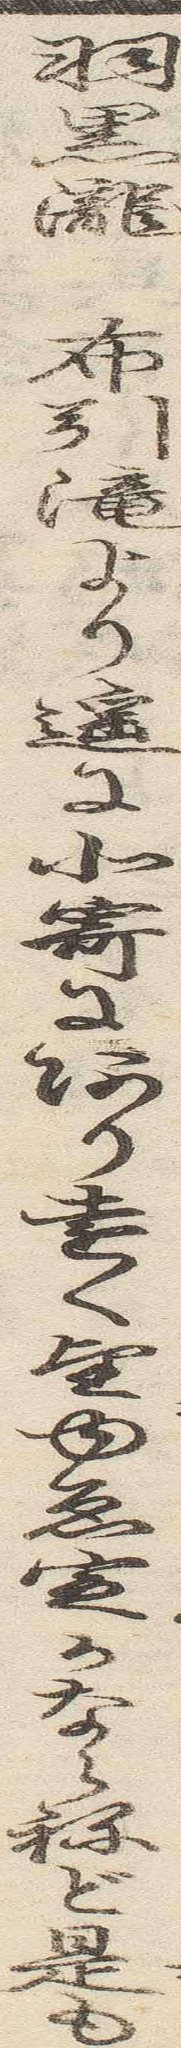羽黒瀧布引滝より遥に北寄にあり遠く望ゆゑ定かならねど是も
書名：日光山志
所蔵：東京学芸大学附属図書館 国文学研究資料館
